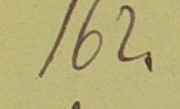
162
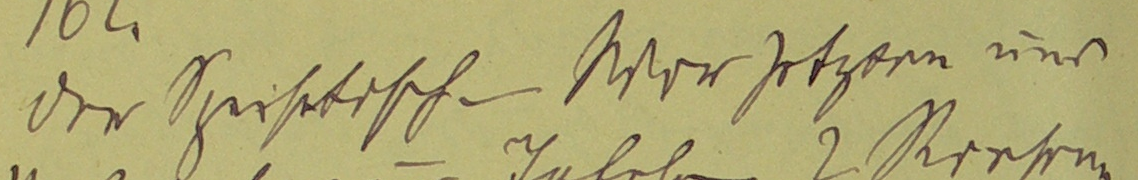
der Speisetisch- Wir setzten uns
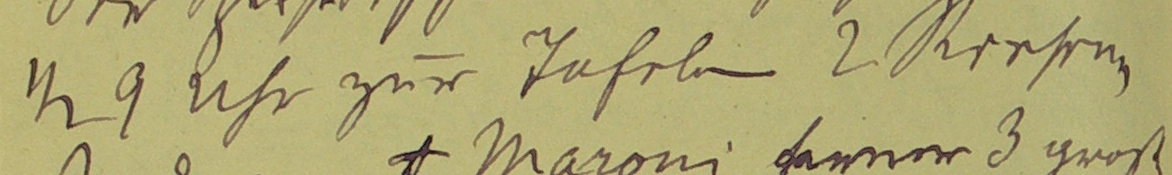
1/2 9 Uhr zur Tafel- 2 ?Strifen
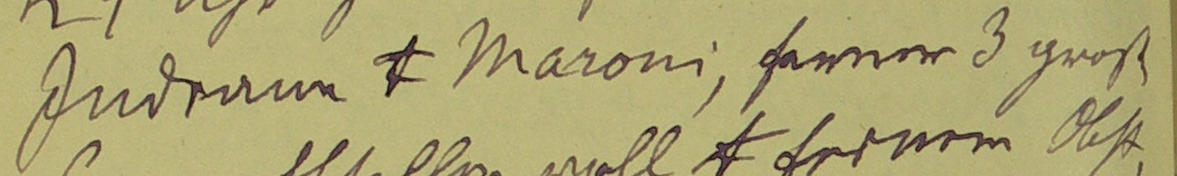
?Indarm mit Maroni, ferner 3 große
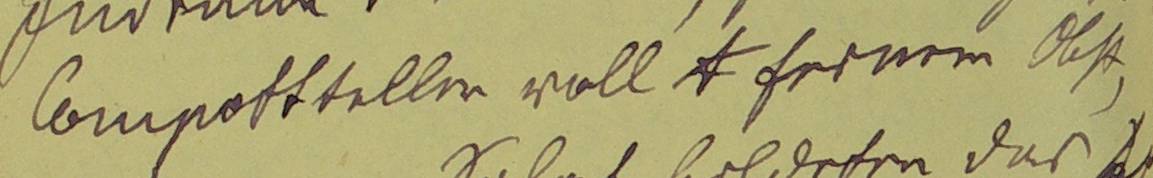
Compottheller voll mit feinem Obst
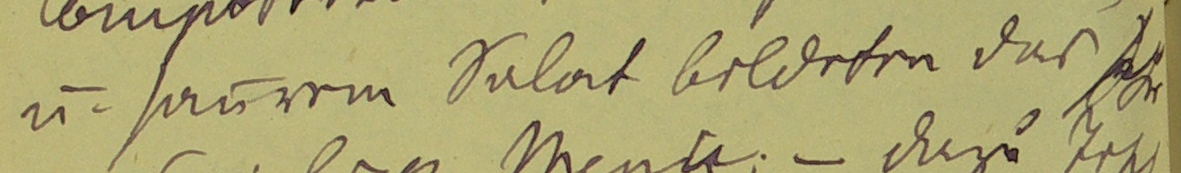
und saurem Salat bildeten das sehr
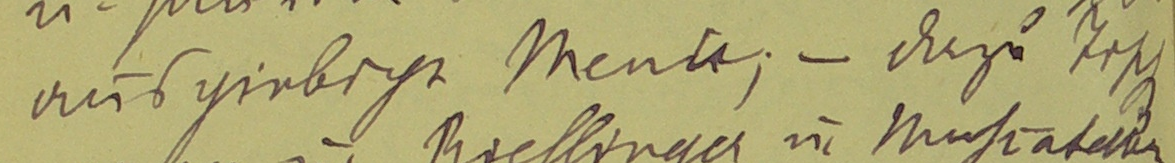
ausgiebige Menü;- dazu Tisch¬
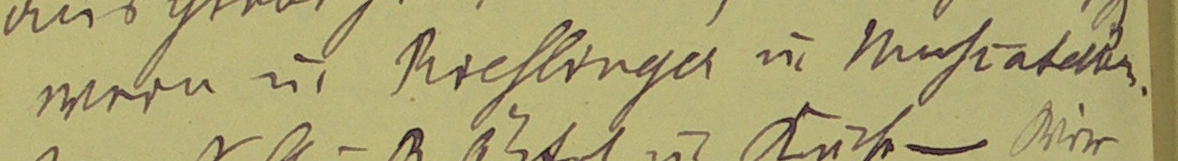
wein und Rieslinger und Nußrateller
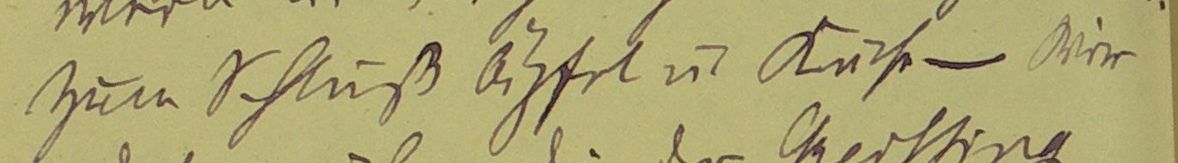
zum Schluß Äpfel und Käse.— Wir
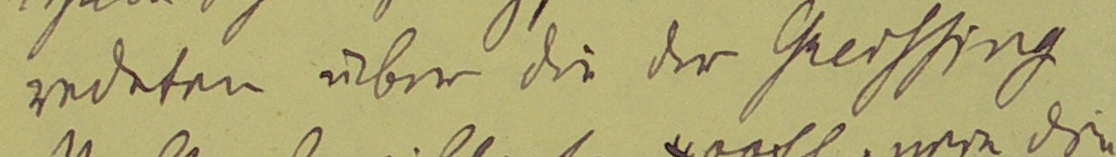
redeten über die der Geissing
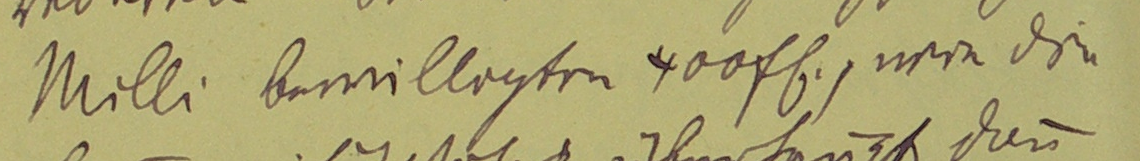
Milli bewilligten 400 Fl., von der
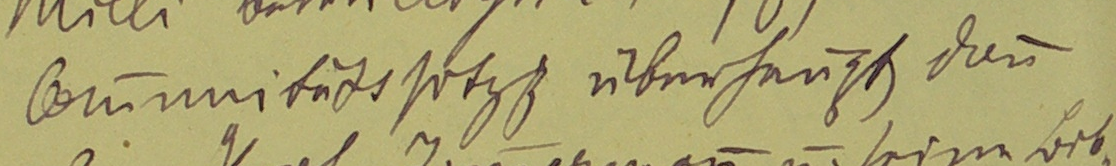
Communitätasirtzung überhaupt, dann
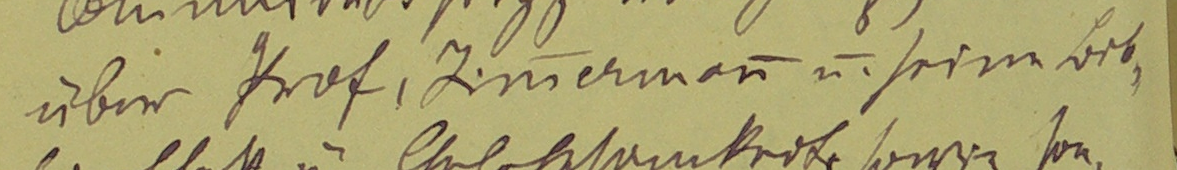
über Prof. Zimmermann und seine Bib¬
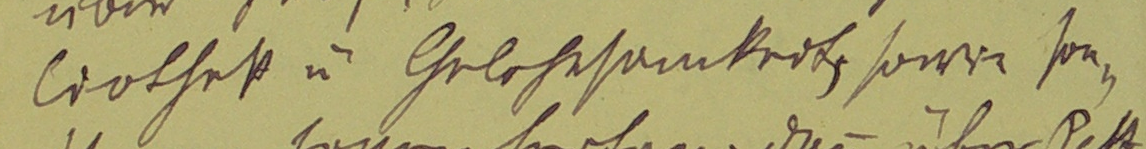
liothek und Gelehrsamkeit sowie son¬
